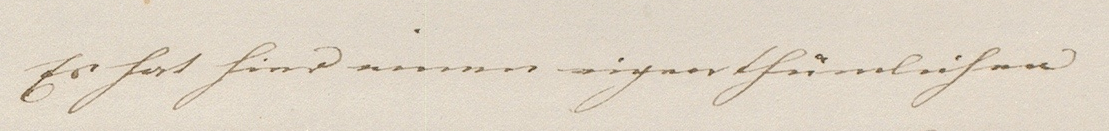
Es hat hier einen eigenthümlichen
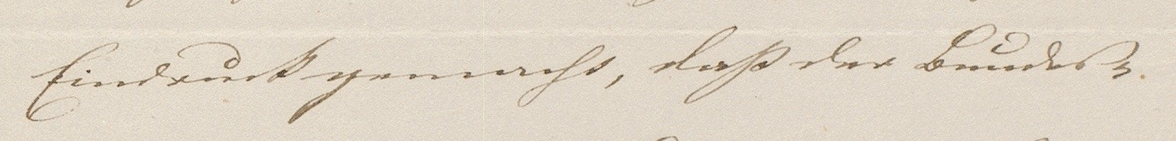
Eindruck gemacht, daß der Bundes-
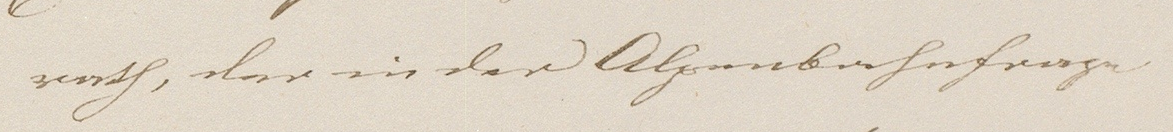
rath, der in der Alpenbahnfrage
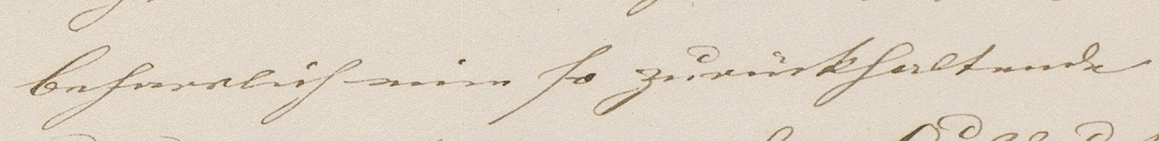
beharrlich eine so zurückhaltende
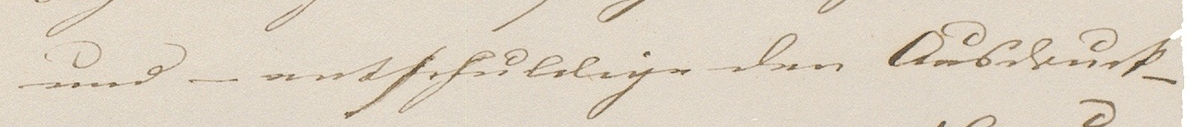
und – entschuldige den Ausdruck –
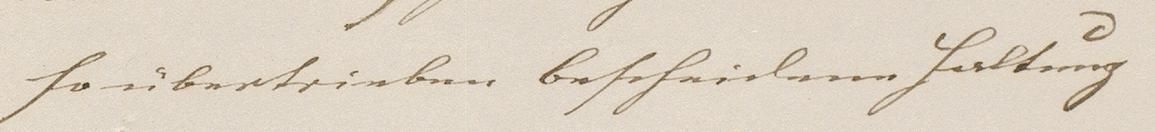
so übertrieben bescheidene Haltung
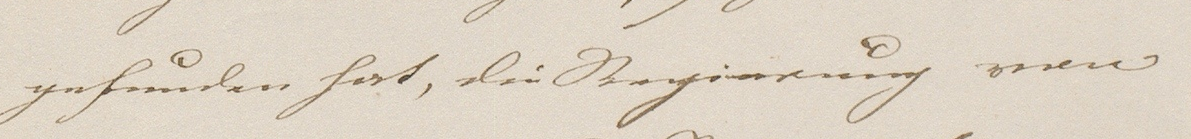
gefunden hat, die Regierung von
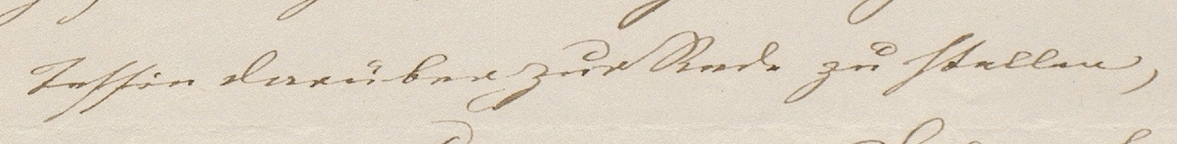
Tessin darüber zur Rede zu stellen,
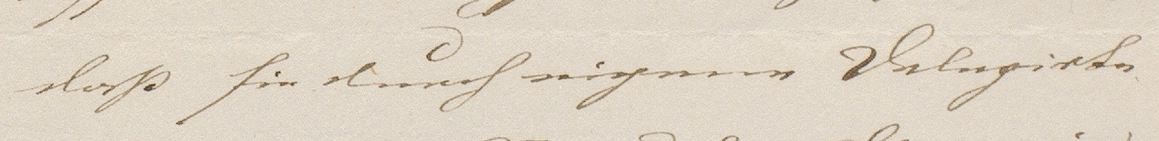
daß sie durch eigene Delegirte
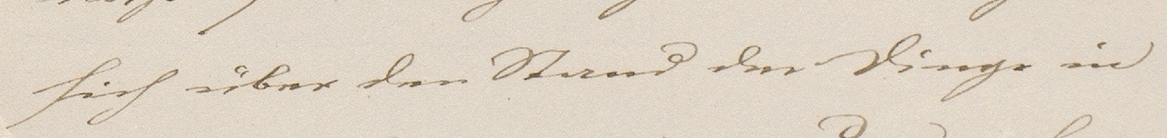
sich über den stand der Dinge in
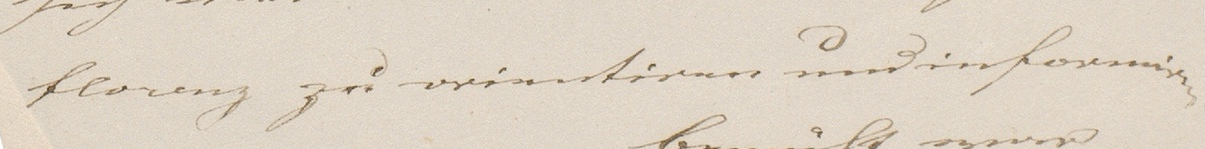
Florenz zu orientiren und informiren
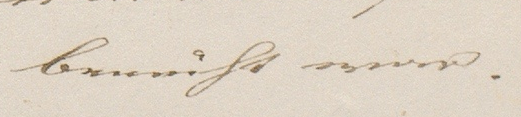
bemüht war.
